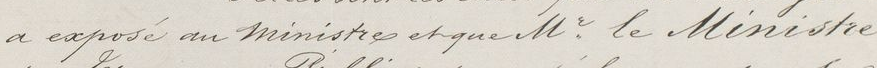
a exposé au Ministre et que Mrle Ministre
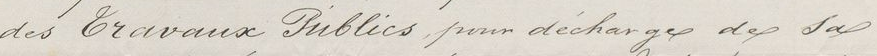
des Travaux Publics, pour décharge de sa
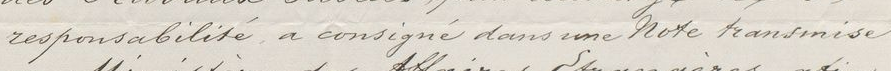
responsabilité a consigné dans une Note transmise
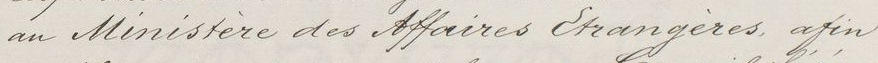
au Ministère des Affaires Etrangères afin
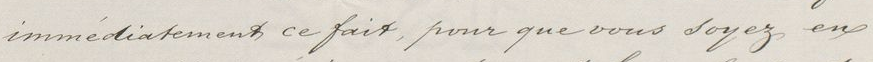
immédiatement ce fait, pour que vous soyez en
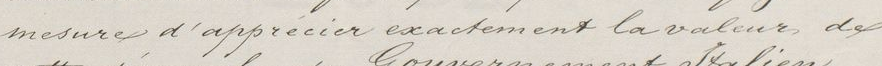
mesure d'apprécier exactement le valeur de
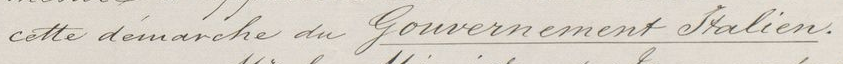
cette démarche du Gouvernement Italien.
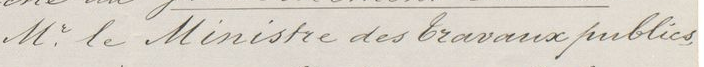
Mr le Ministre des Travaux publics,
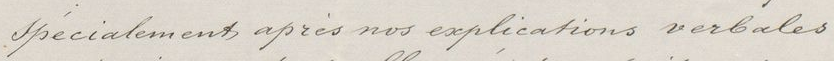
spécialement après nos explications verbales,
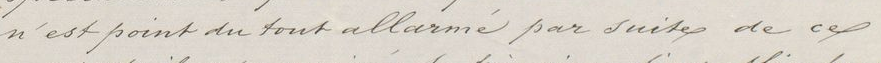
n'est point du tout allarmé par suite de ce
